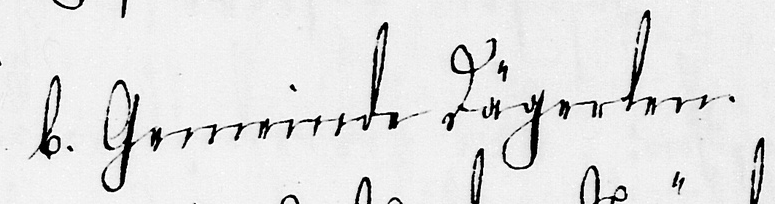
b. Gemeinde Dägerlen.
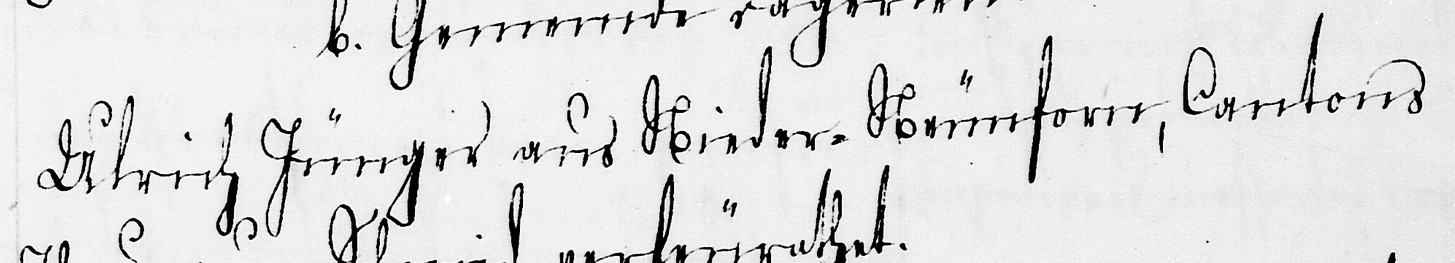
Ulrich Jünger aus Nieder-Neunforn, Cantons
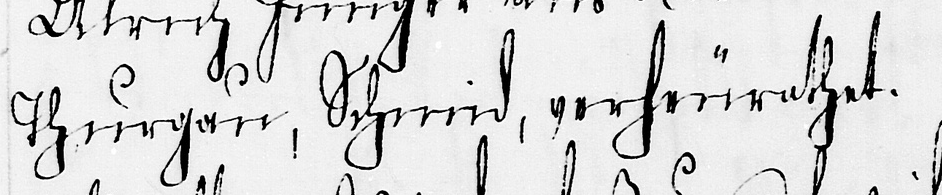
Thurgau, Schmid, verheurathet.
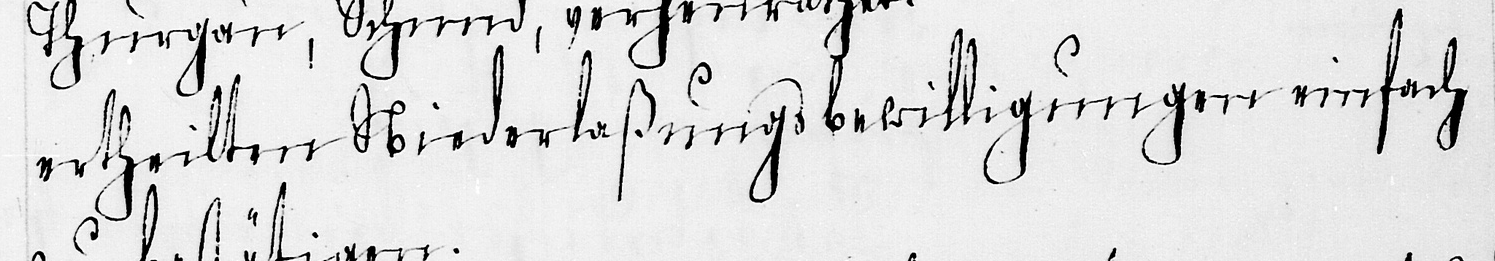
ertheilten Niederlaßungsbewilligungen einfach
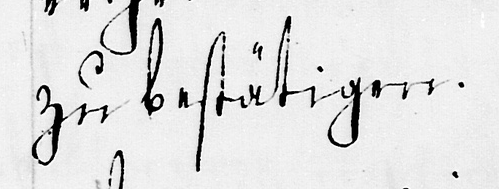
zu bestätigen.
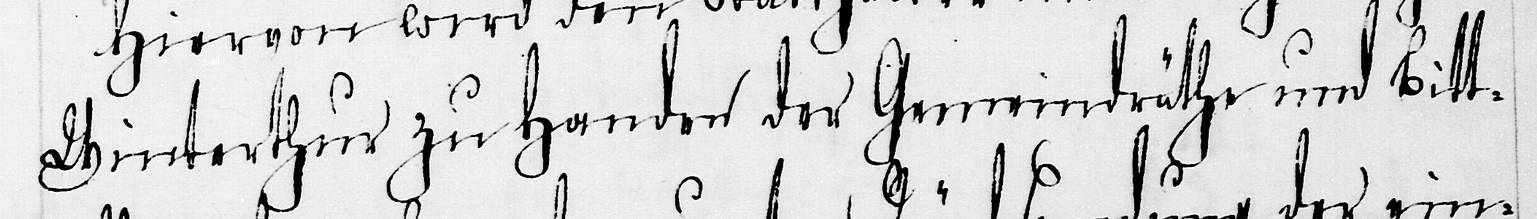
Winterthur zu Handen der Gemeindräthe und Bitt¬
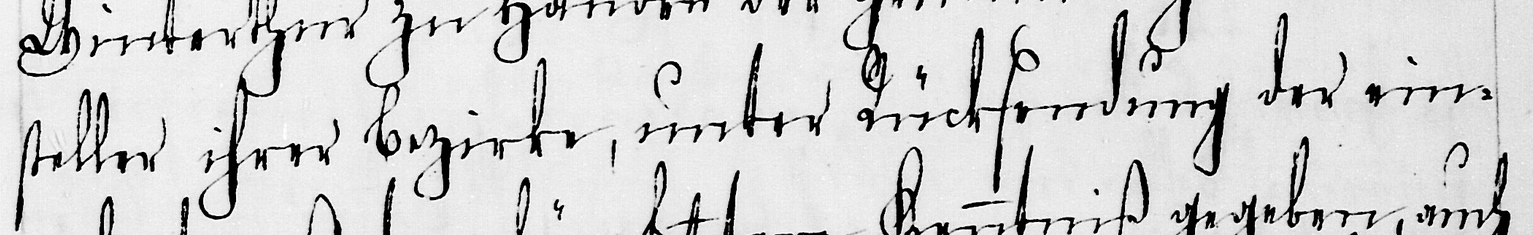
teller ihrer Bezirke, unter Rücksendung der ein¬
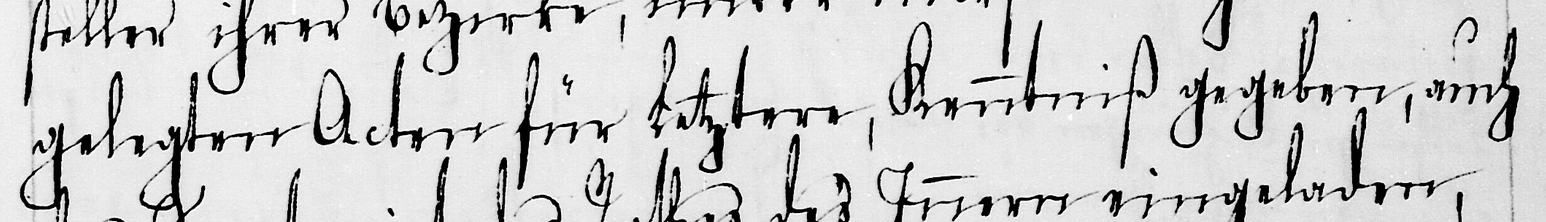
gelegten Acten für Letztere, Kenntniß gegeben, auch
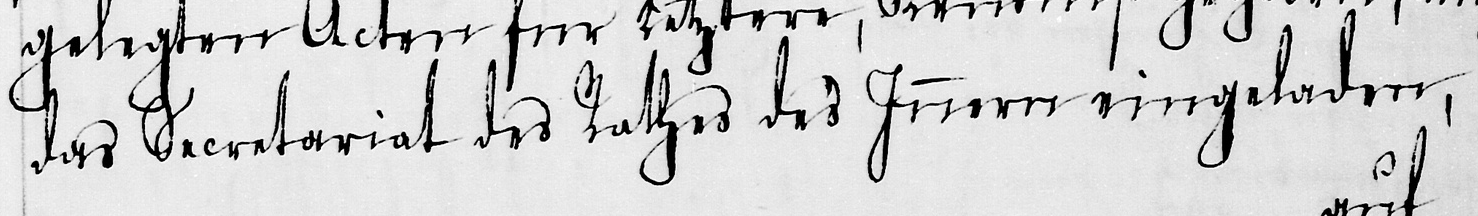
das Secretariat des Rathes des Innern eingeladen,
